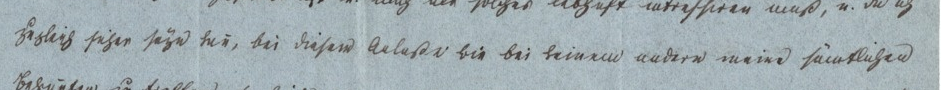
zugleich sicher seyn kann, bei diesem Anlasse wie bei keinem andern meine sämtlichen
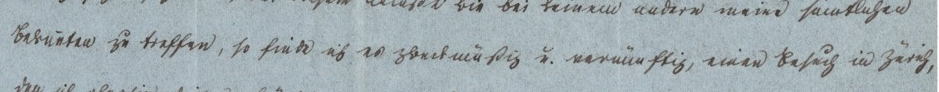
Bekannten zu treffen, so finde ich es zweckmäßig u. vernünftig, einen Besuch in Zürich,
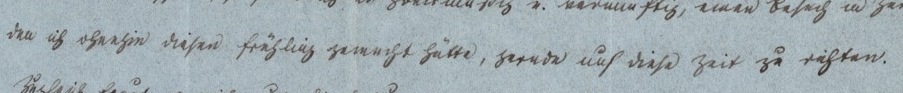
den ich ohnehin diesen Frühling gemacht hätte, gerade auf diese Zeit zu richten.
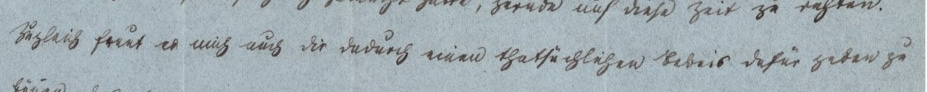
Herzlich freut es mich auch dir dadurch einen thatsächlichen Beweis dafür geben zu
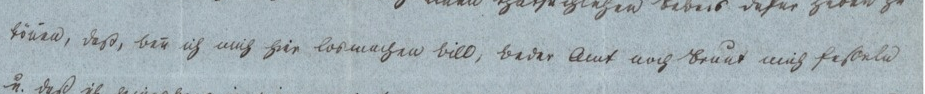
können, daß, wenn ich mich hier losmachen will, weder Amt noch Braut mich fesseln
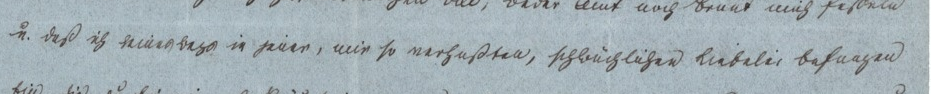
u. daß ich keineswegs in jener, mir so verhaßten, schwächlichen Liebelei befangen
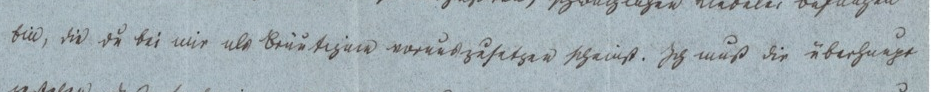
bin, die du bei mir als Bräutigam vorauszusetzen scheinst. Ich muß dir überhaupt
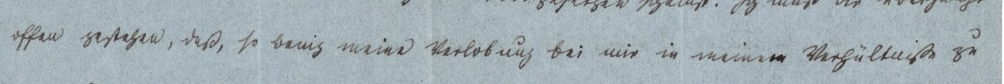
offen gestehen, daß, so wenig meine Verlobung bei mir in meinem Verhältnisse zu
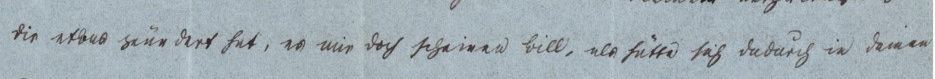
dir etwas geändert hat, es mir doch scheinen will, als hätte sich dadurch in deinen
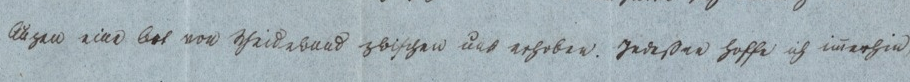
Augen eine Art von Scheidewand zwischen uns erhoben. Indessen hoffe ich immerhin,
